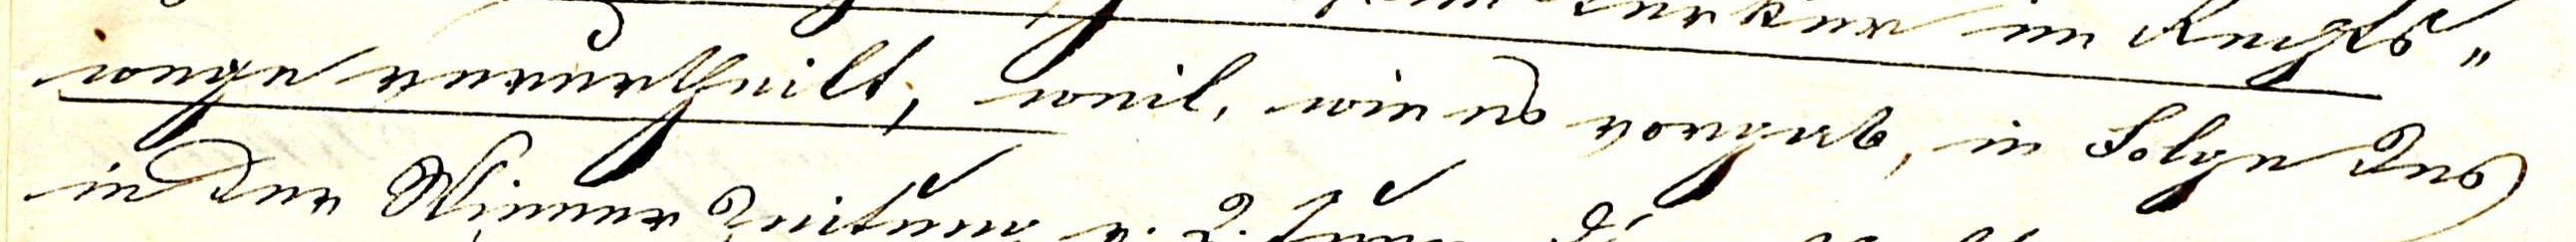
wege verurtheilt, weil wie es vorgab, in Folge des
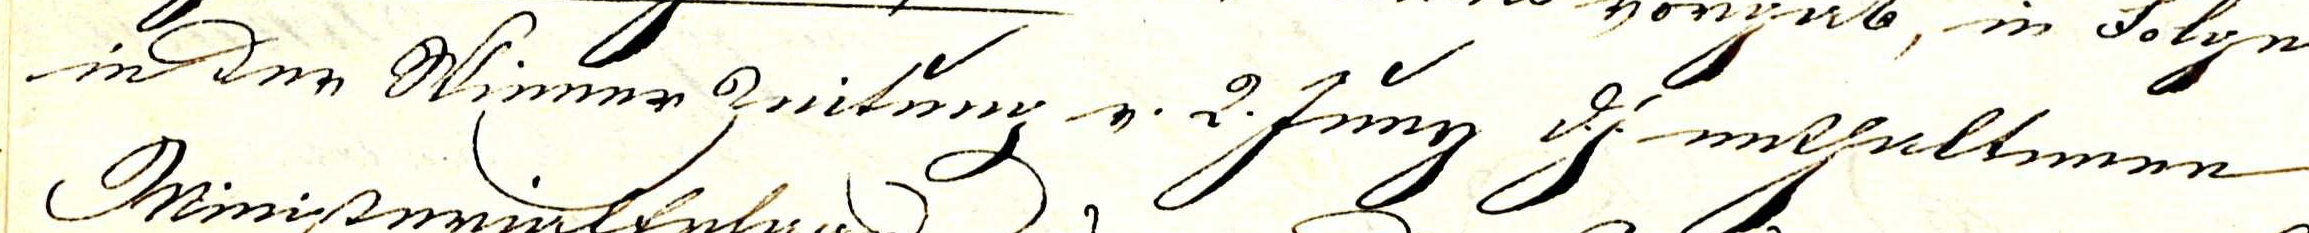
in der Wiener Zeitung v. 2. Juny d.J. enthaltenen
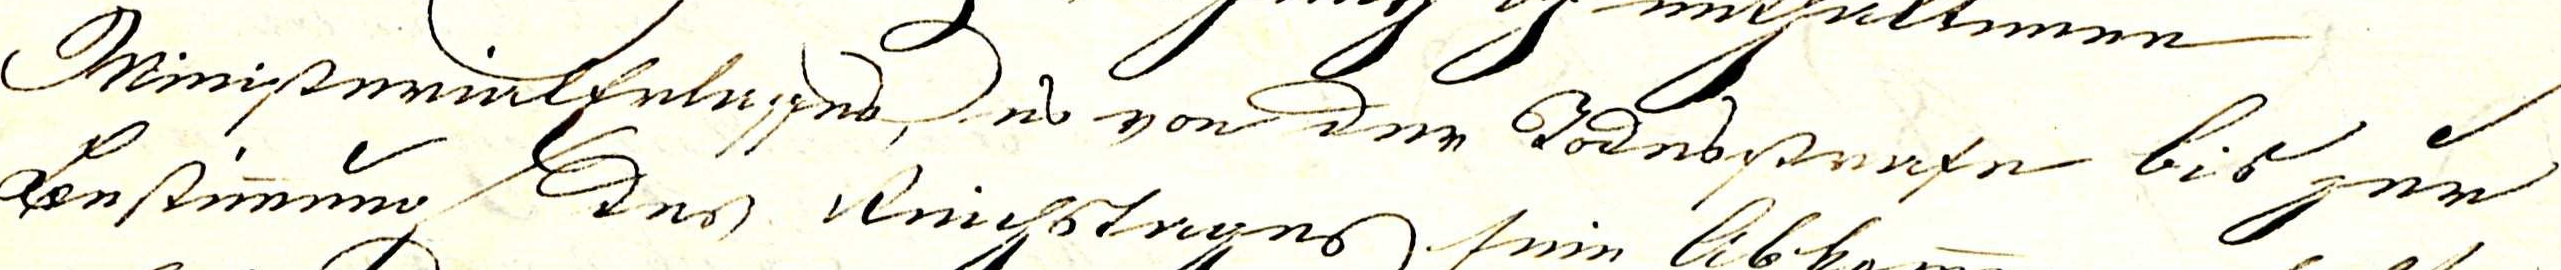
Ministerial Erlasses, es von der Todesstrafe bis zur
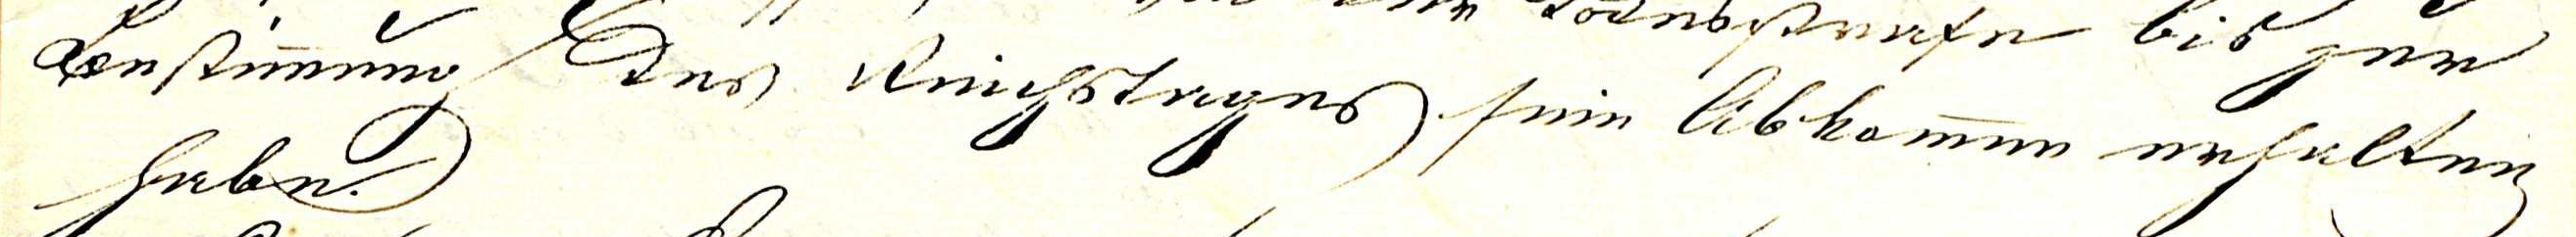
Bestimmung des Reichstages sein Abkommen erhalten
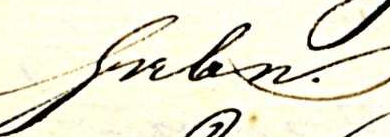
habe.
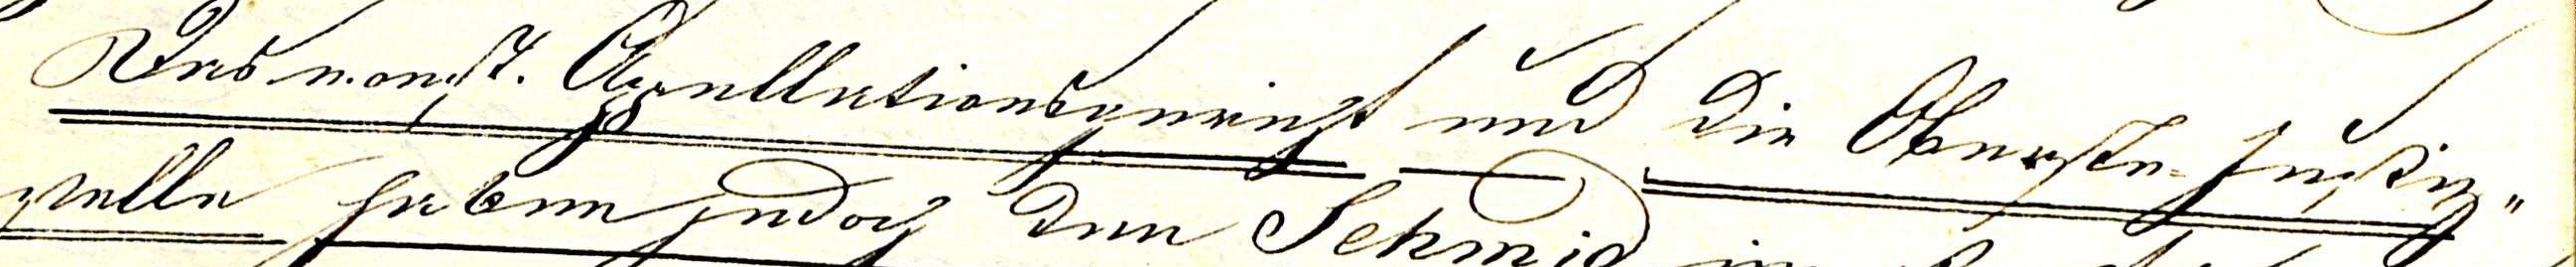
Das n. oest. Appellationsgericht und die Oberste Justiz¬
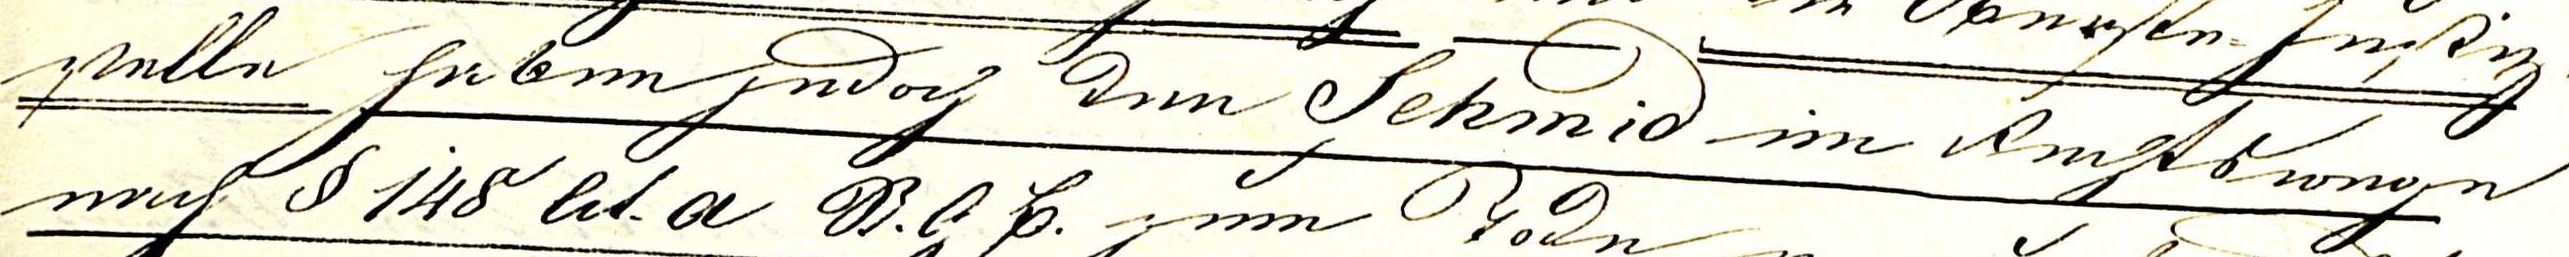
stelle haben jedoch Schmid in Rechtswege
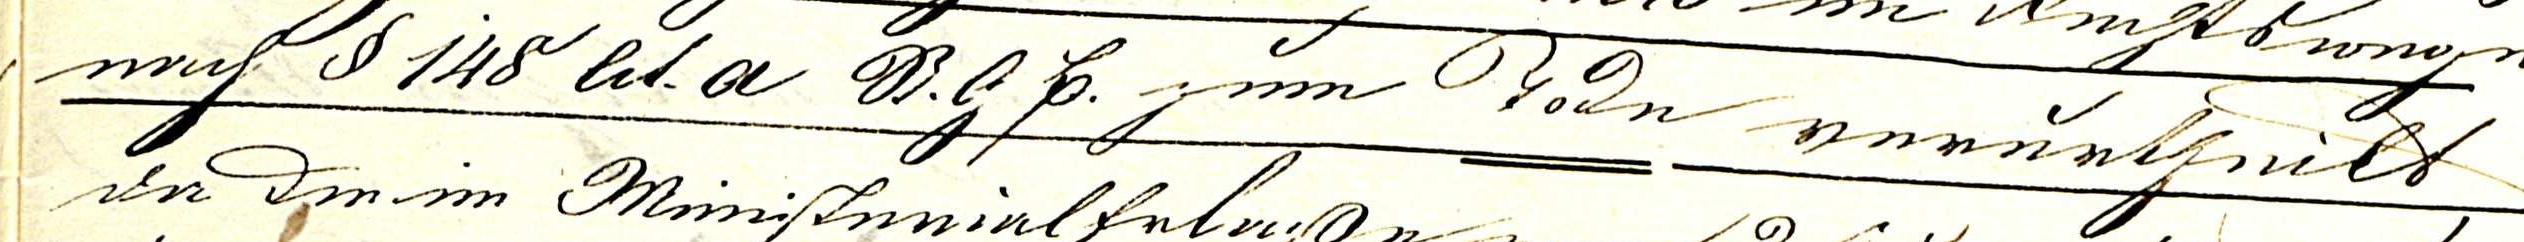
nach §148 lit a StGB zum Tode verurtheilt,
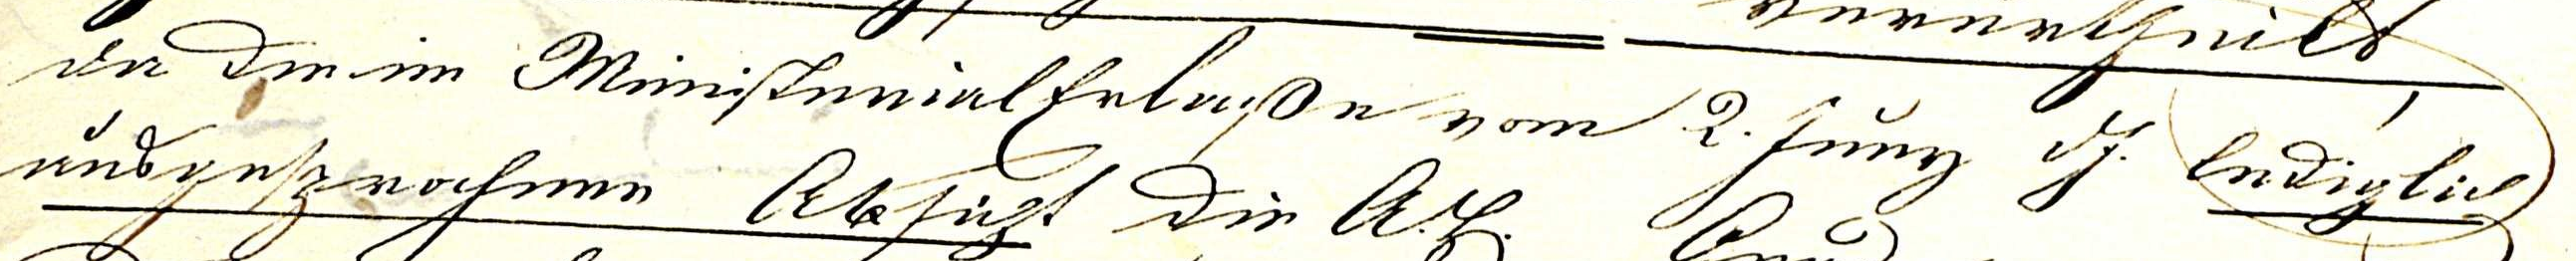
da die im Ministerial Erlasse vom 2. Juny dJ lediglich
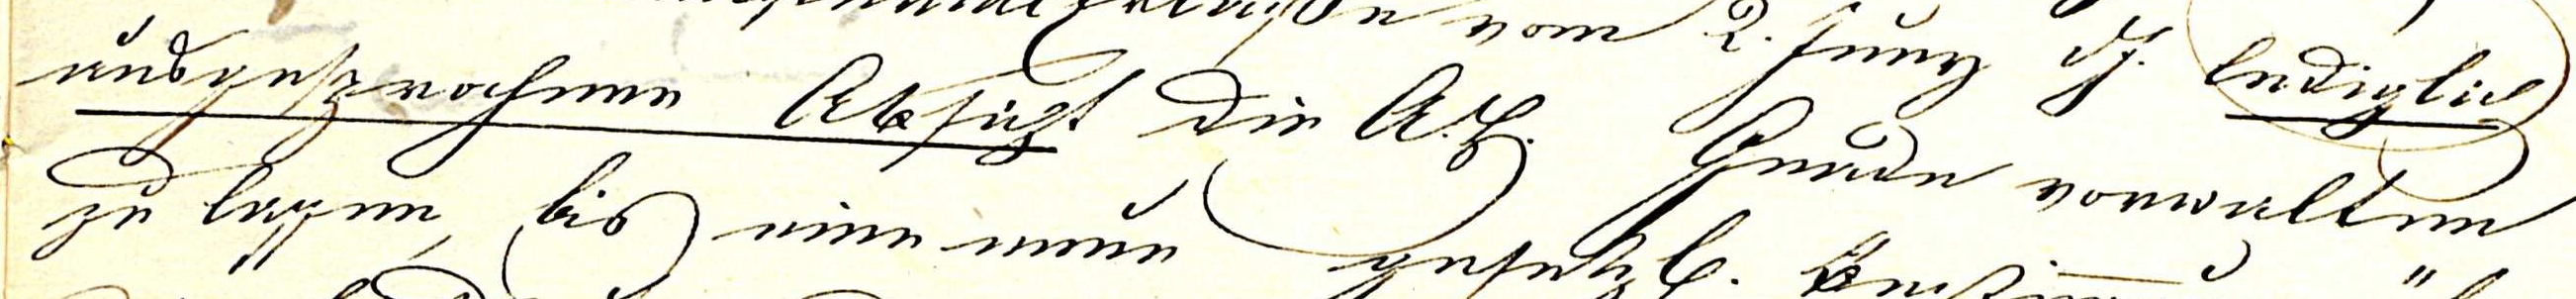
ausgesprochene Absicht die A.H. Gnade vorwalten
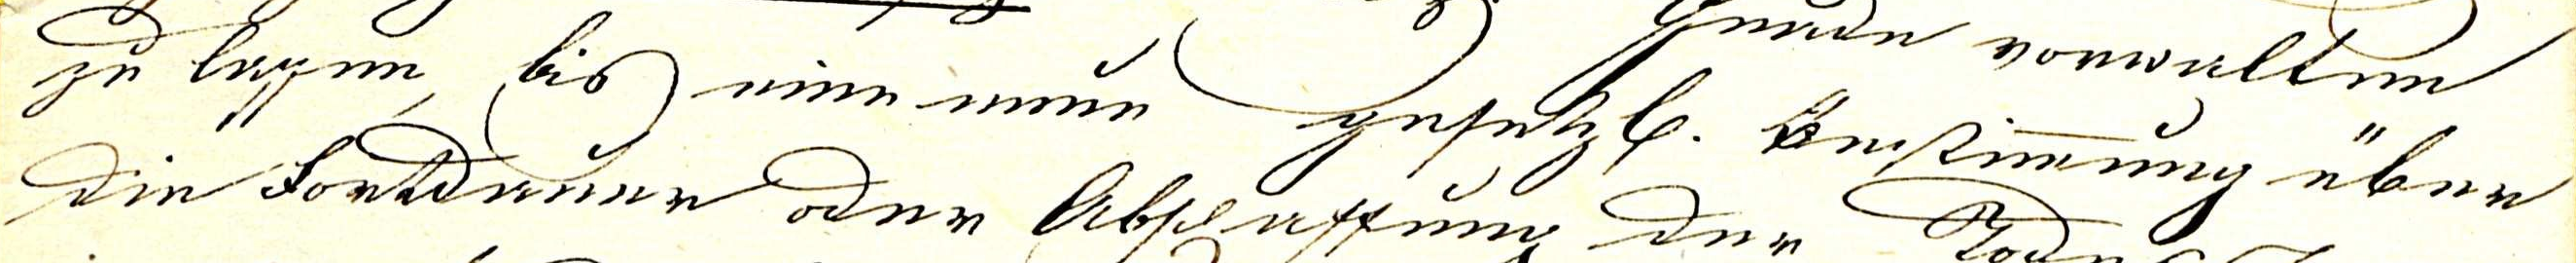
zu lassen, bis eine neue gesetzl. Bestimmung über
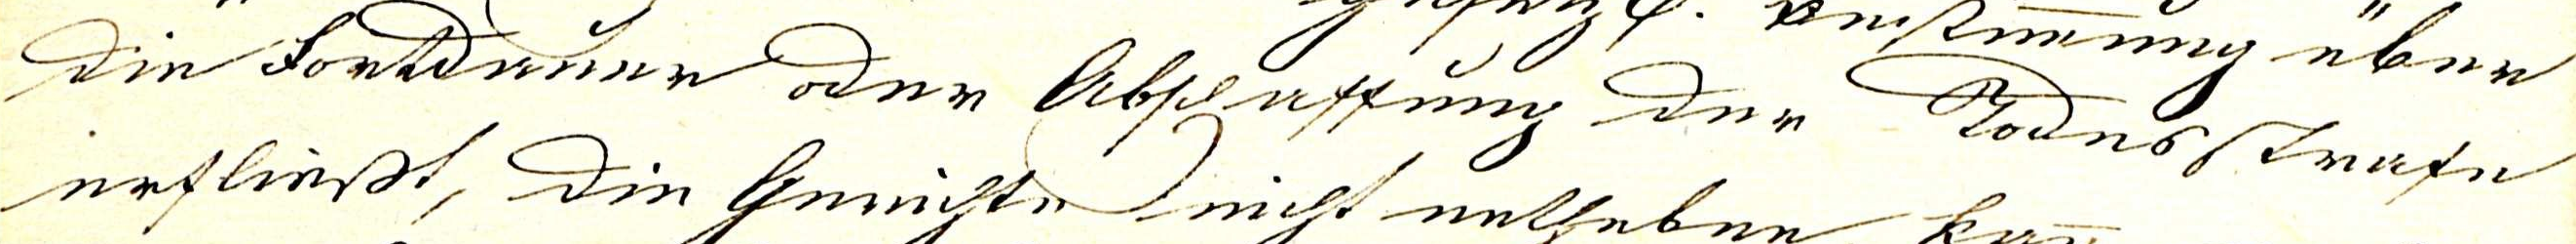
die Fortdauer oder Abschaffung der Todesstrafe
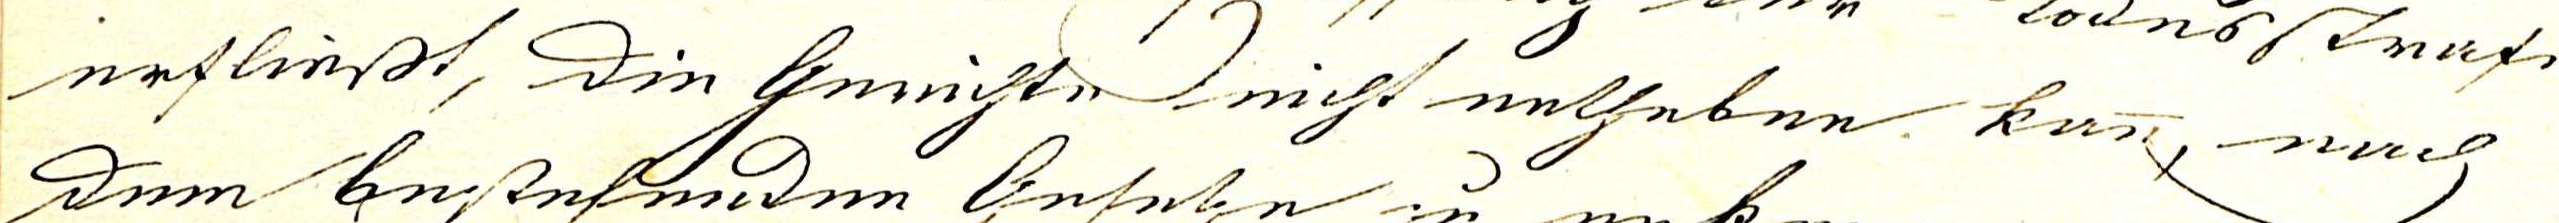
erfließt, die Gerichte nicht entheben kann, nach
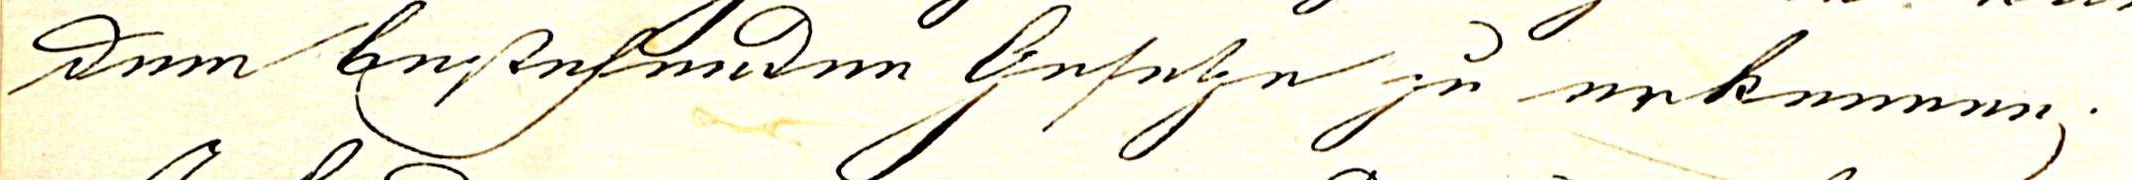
dem bestehenden Gesetze zu erkennen.
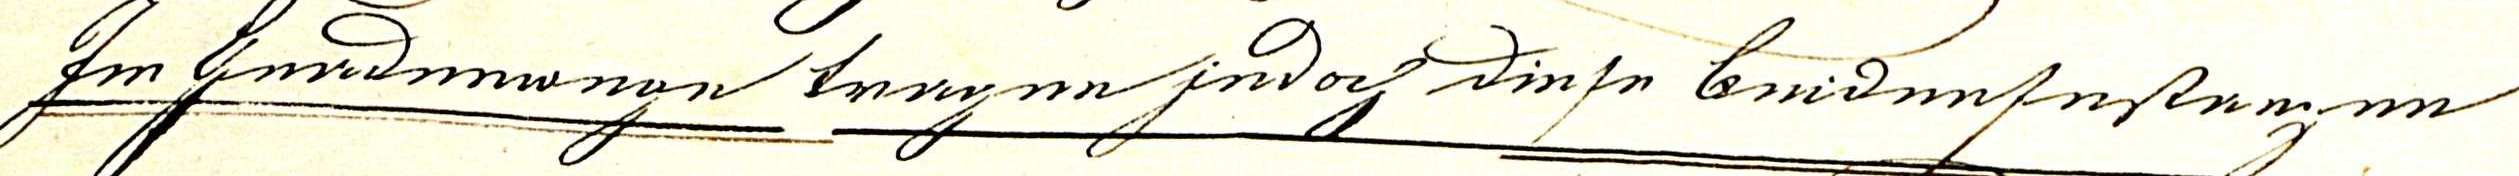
Im Gnadenwege tragen jedoch diese beiden Instanzen
